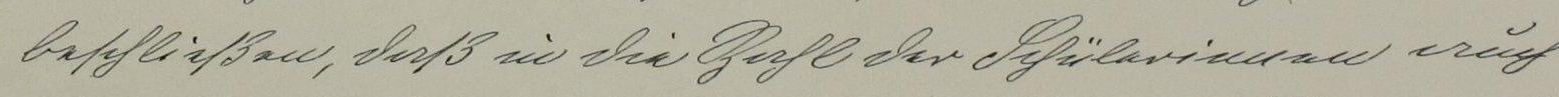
beschließen, daß in die Zahl der Schülerinnen auch
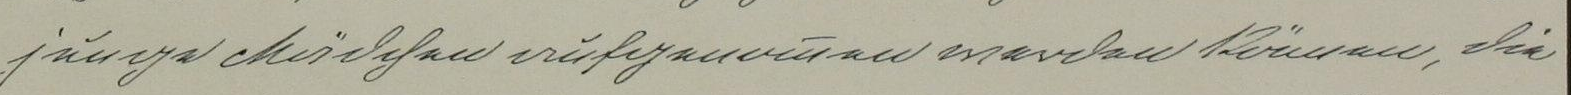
junge Mädchen aufgenommen werden können, die
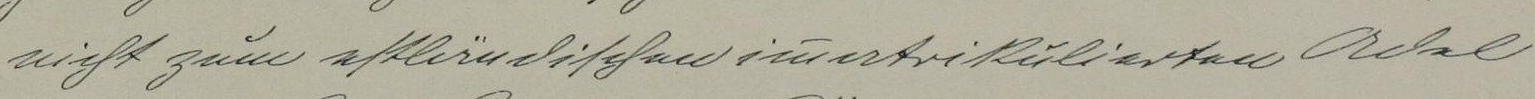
nicht zum estländischen immatrikulierten Adel
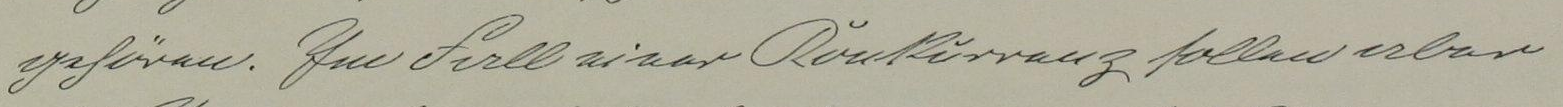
gehören. Im Fall einer Konkurrenz sollen aber
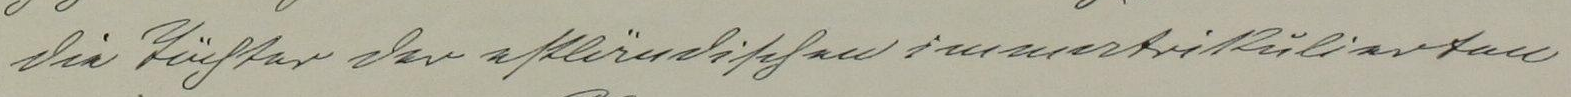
die Töchter der estländischen immatrikulierten
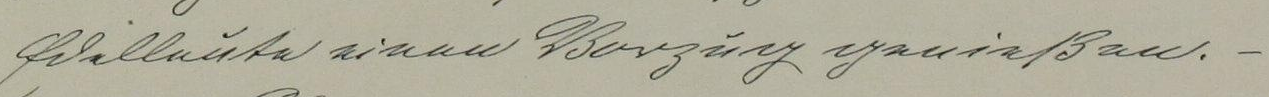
Edelleute einen Vorzug genießen.
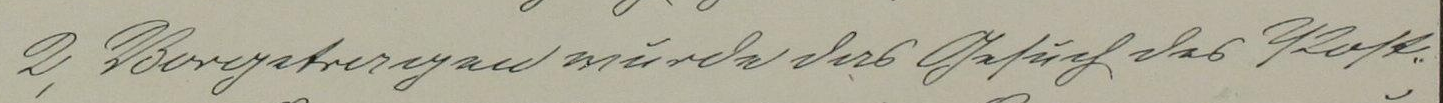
2. Vorgetragen wurde das Gesuch des Post-
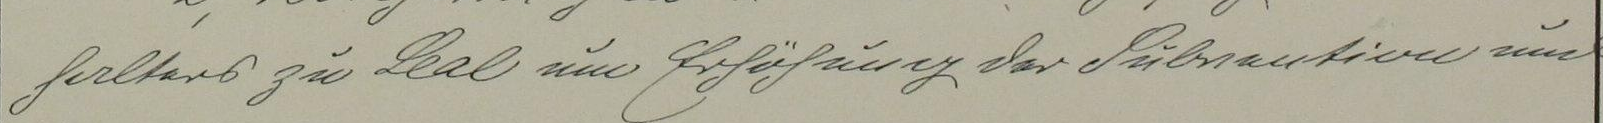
halters zu Leal um Erhöhung der Subvention und
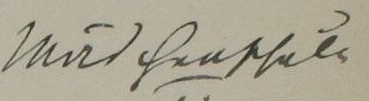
Mädchenschule
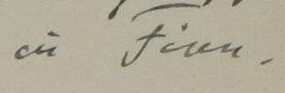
in Finn
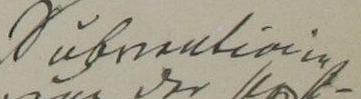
Subventionie
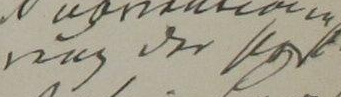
rung der Post
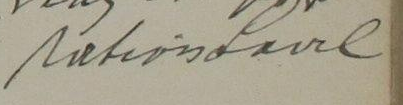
station Leal
